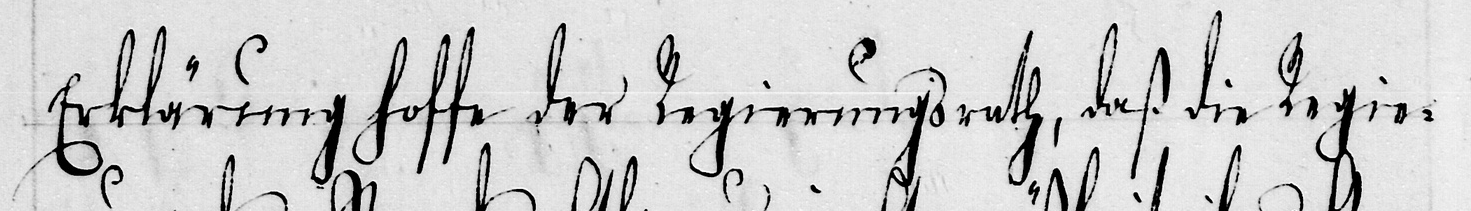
Erklärung hoffe der Regierungsrath, daß die Regie¬
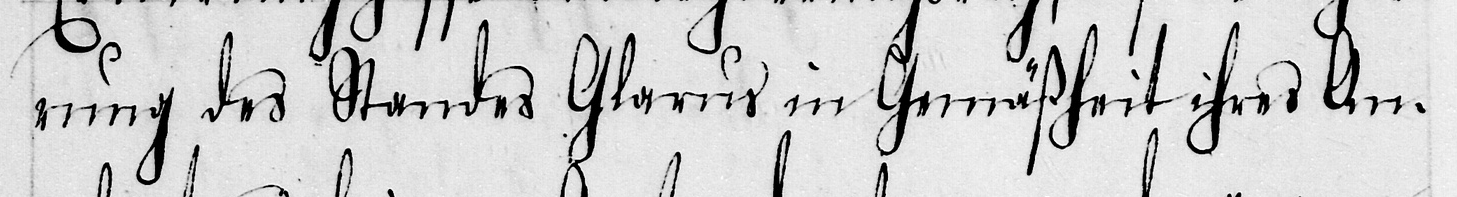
rung des Standes Glarus in Gemäßheit ihres An¬
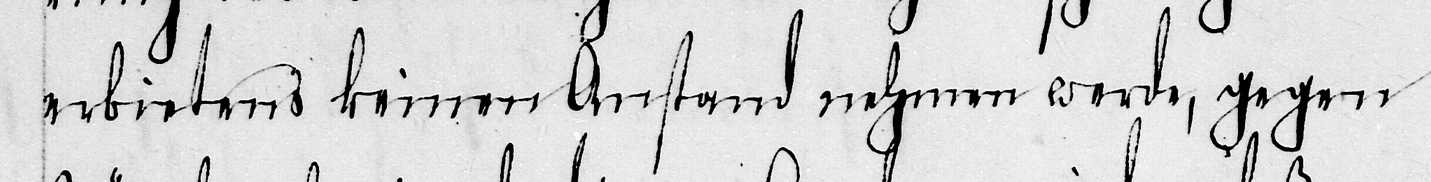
erbietens keinen Anstand nehmen werde, gegen
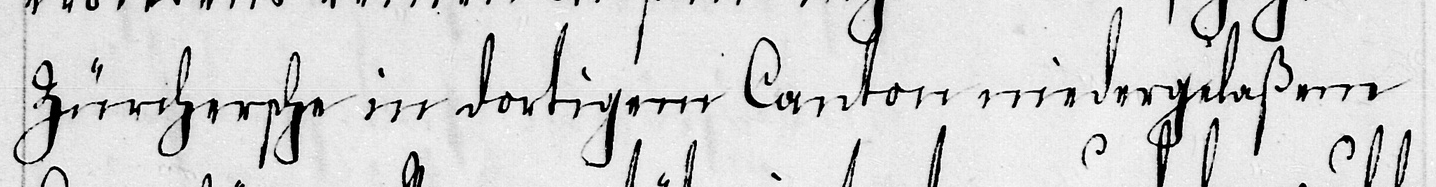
Zürchersche in dortigem Canton niedergelaßene
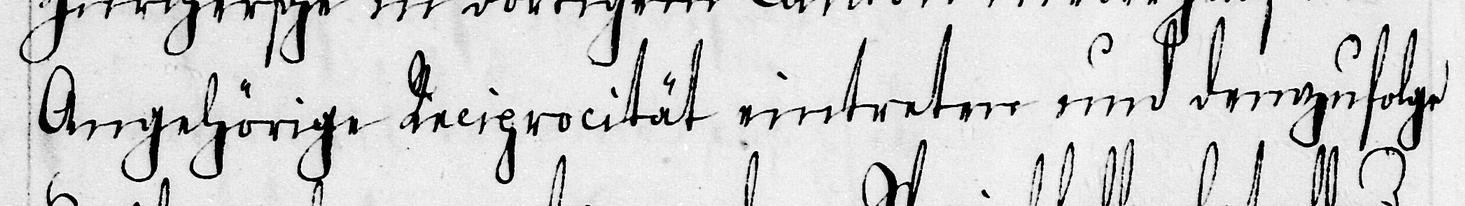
Angehörige Reciprocität eintreten und demzufolge
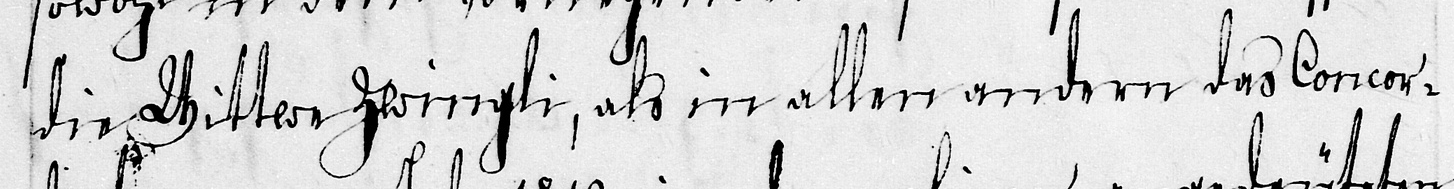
die Wittwe Zwingli, als in allen andern das Concor¬
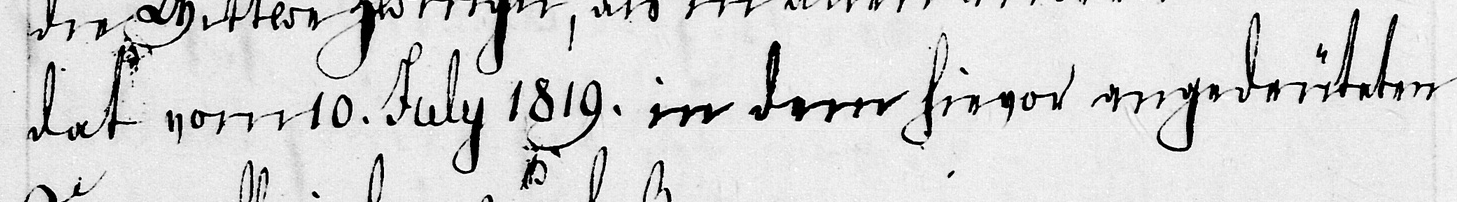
dat vom 10. July 1819. in dem hievor angedeuteten
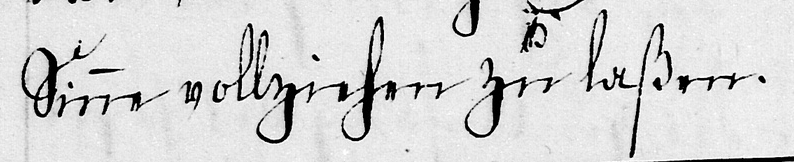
Sinne vollziehen zu laßen.
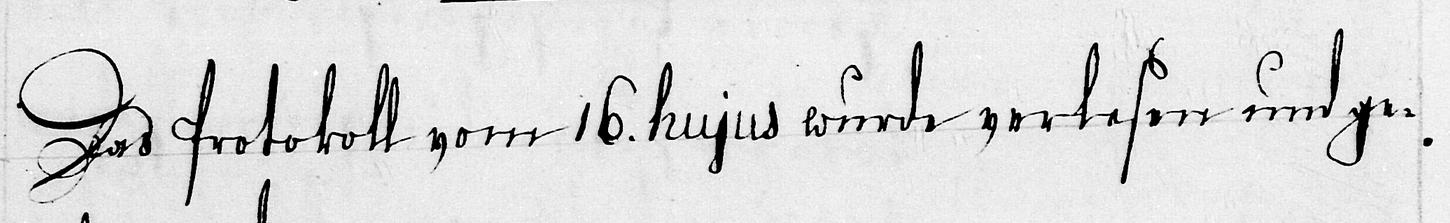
Das Protokoll vom 16. hujus wurde verlesen und ge¬
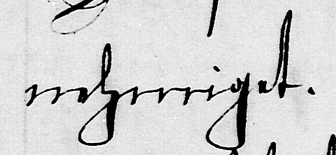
nehmiget.
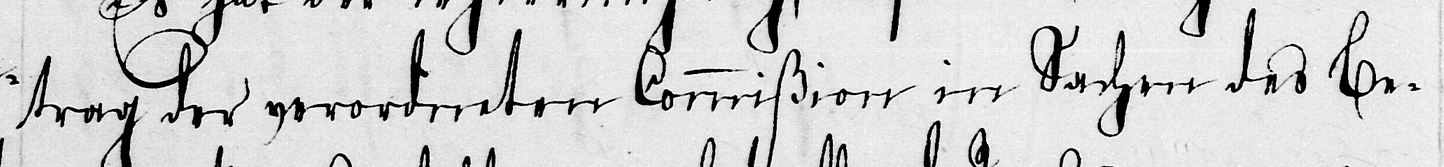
trag der verordneten Commißion in Sachen des Be¬
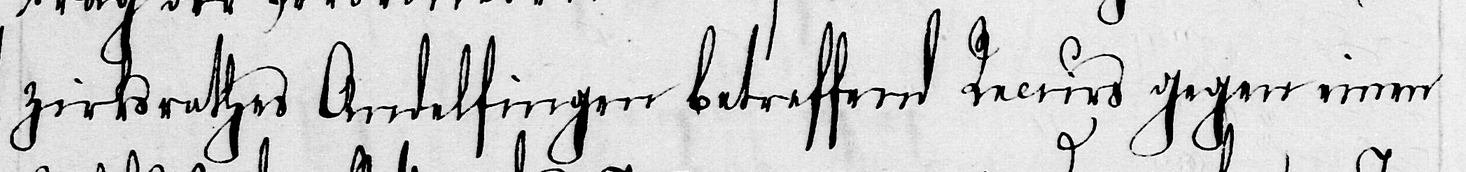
zirksrathes Andelfingen betreffend Recurs gegen einen
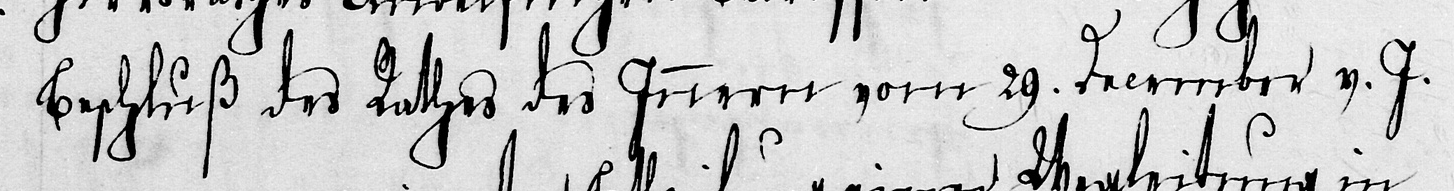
Beschluß des Rathes des Innern vom 20. December v. J.
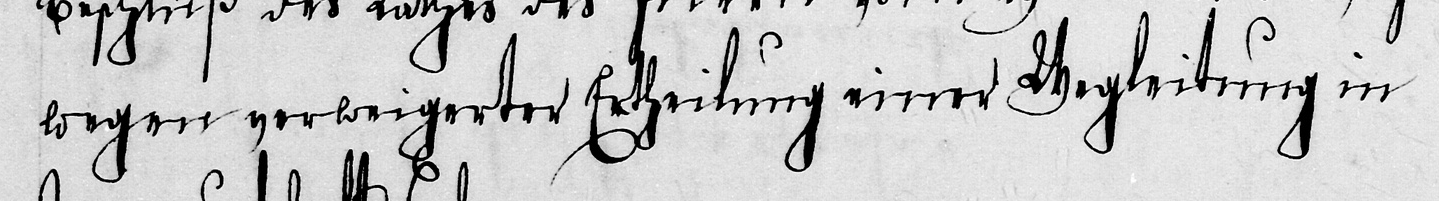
wegen verweigerter Ertheilung einer Wegleitung in
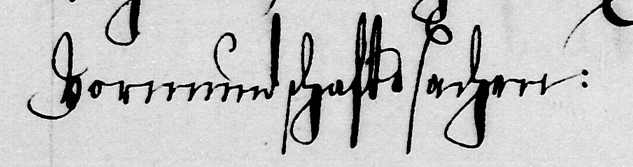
Vormundschaftssachen:
